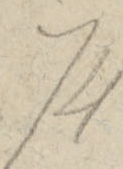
74
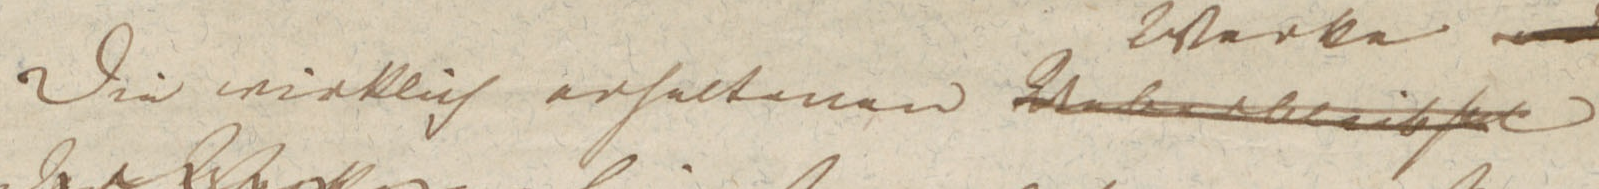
Die wirklich erhaltenen Ueberbleibsel
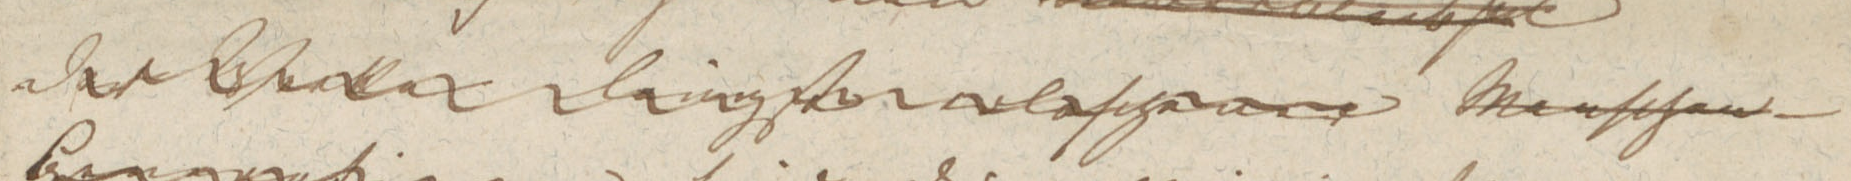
der Werke längst erloschener Menchen-
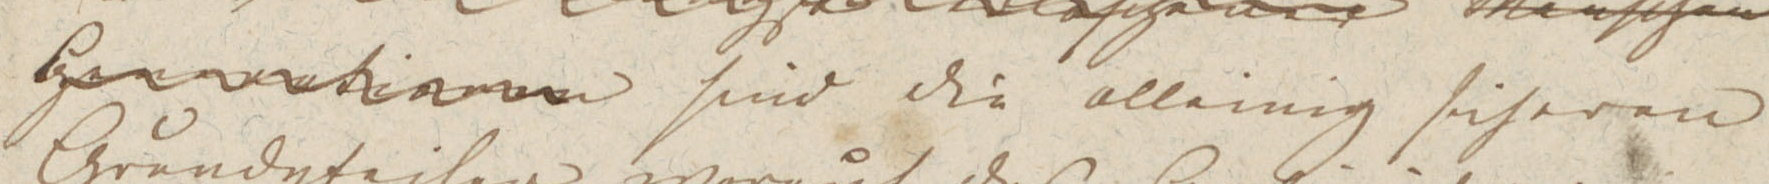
Generationen sind die alleinig sicheren
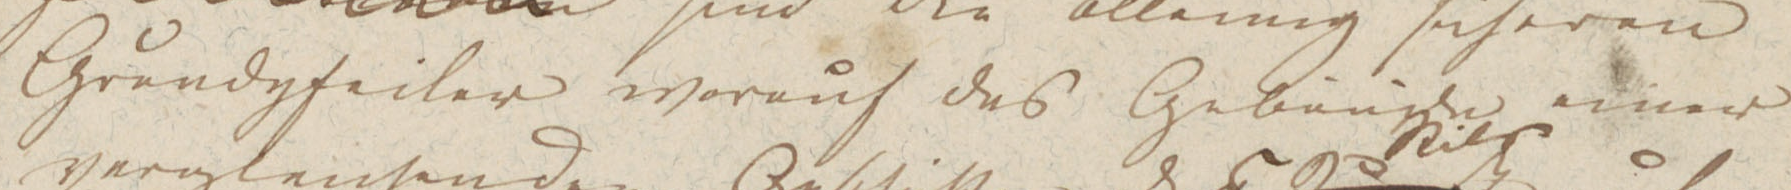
Grundpfeiler worauf das Gebäude einer
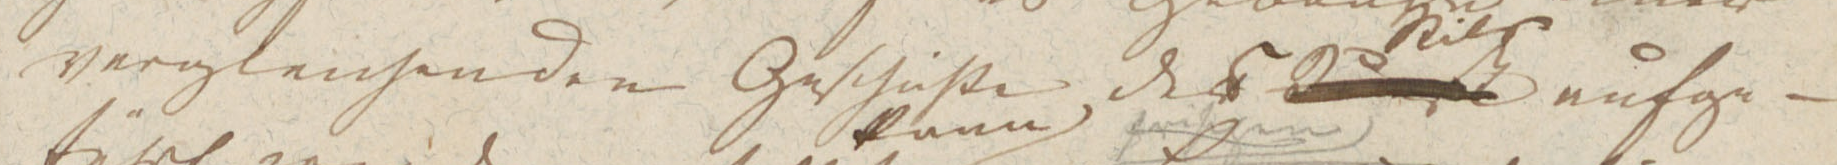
vergleichenden Geschichte ders Kunst Stils aufge-
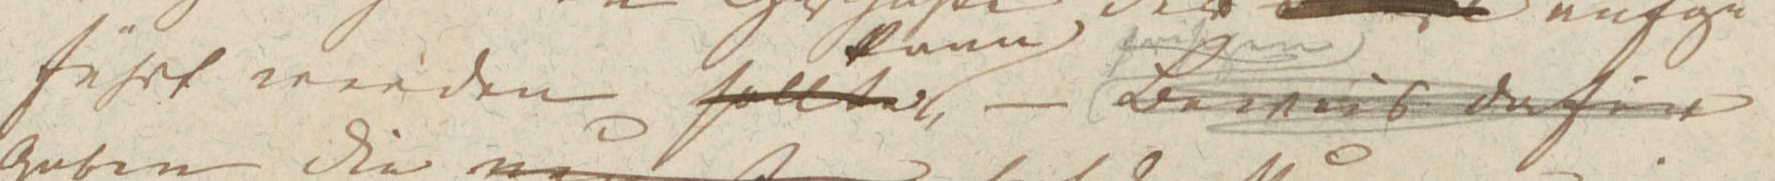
führt werden sollte kann, – frischenBeweis dafür
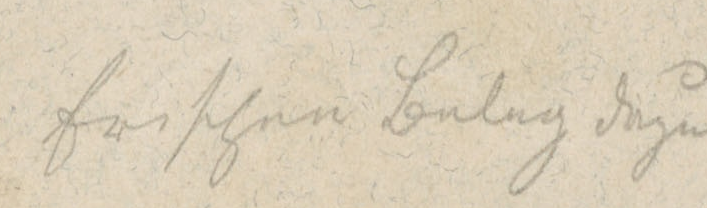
frischen Beleg dazu
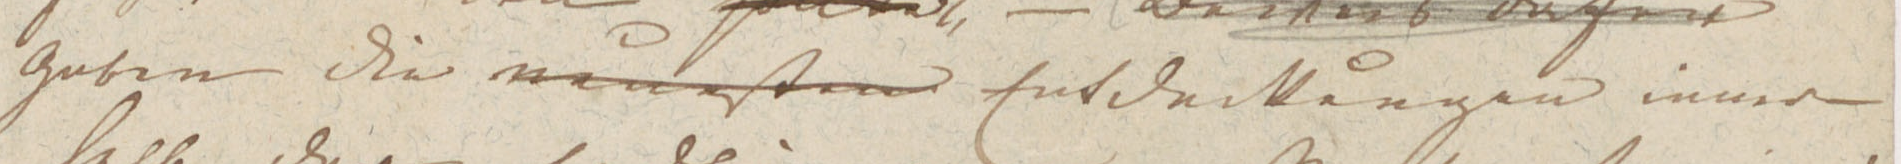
gaben die neuesten Entdeckungen inner-
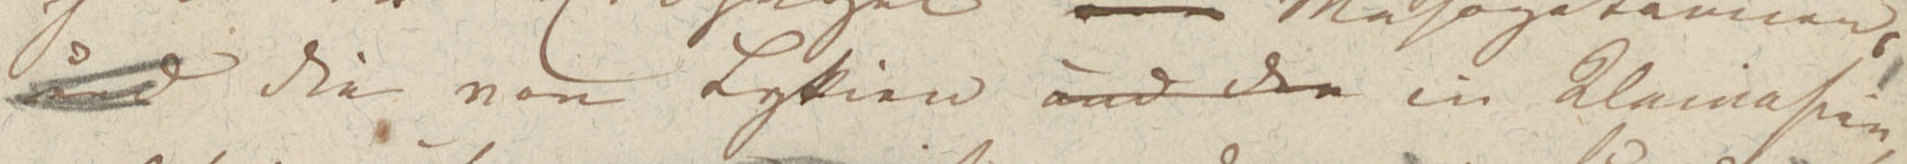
und die von Lykien und der in Kleinasien,
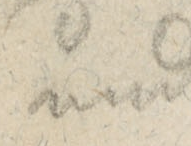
und
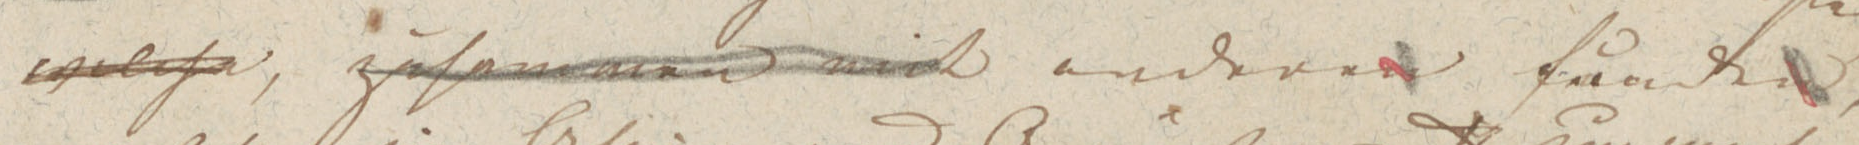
welche, zusammen mit anderen Funden,
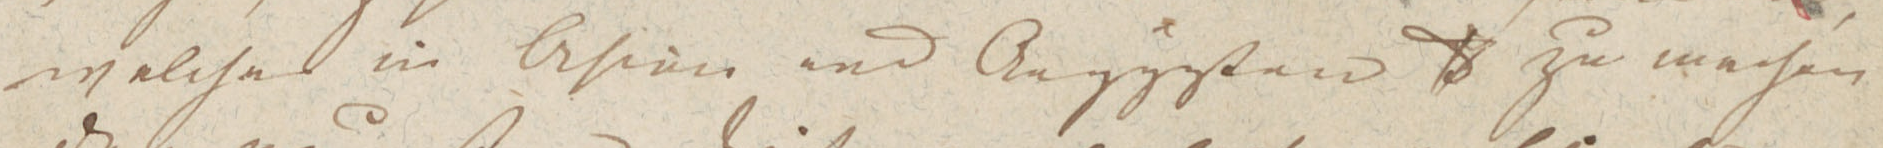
welche in Asien und Aegypten d zu machen
